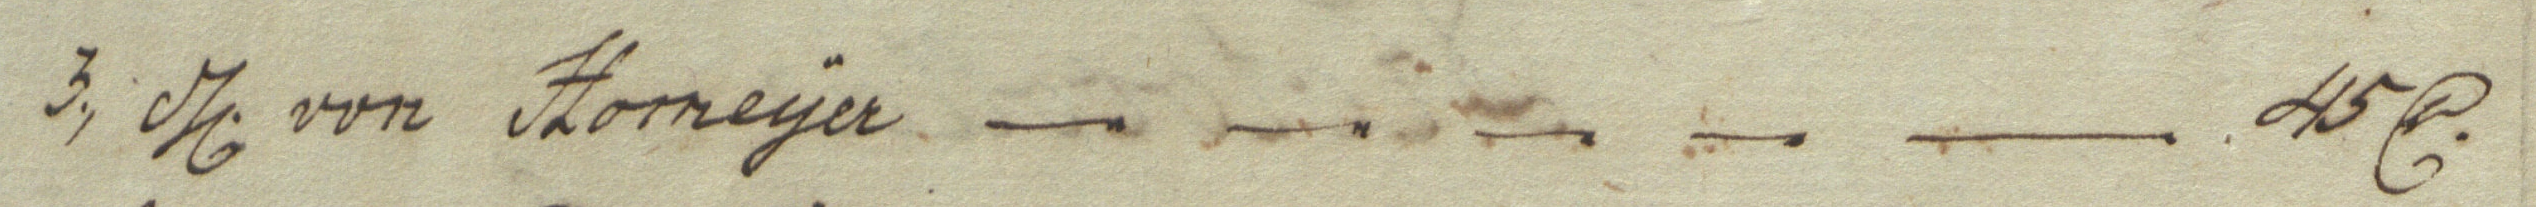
3. dh. von Homeyer -"-"-"-"- 45rtl.
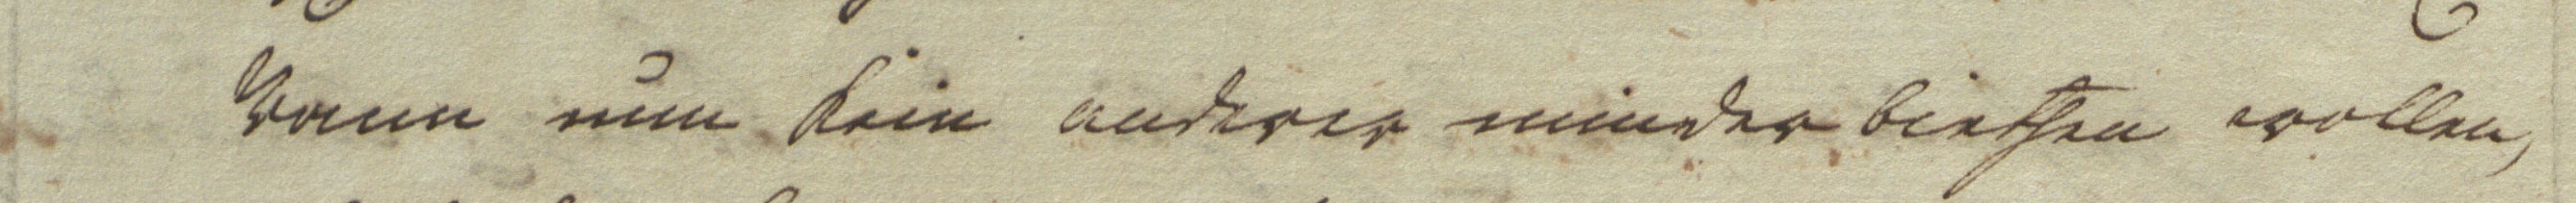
Wann nun kein andrer minder biethen wollen,
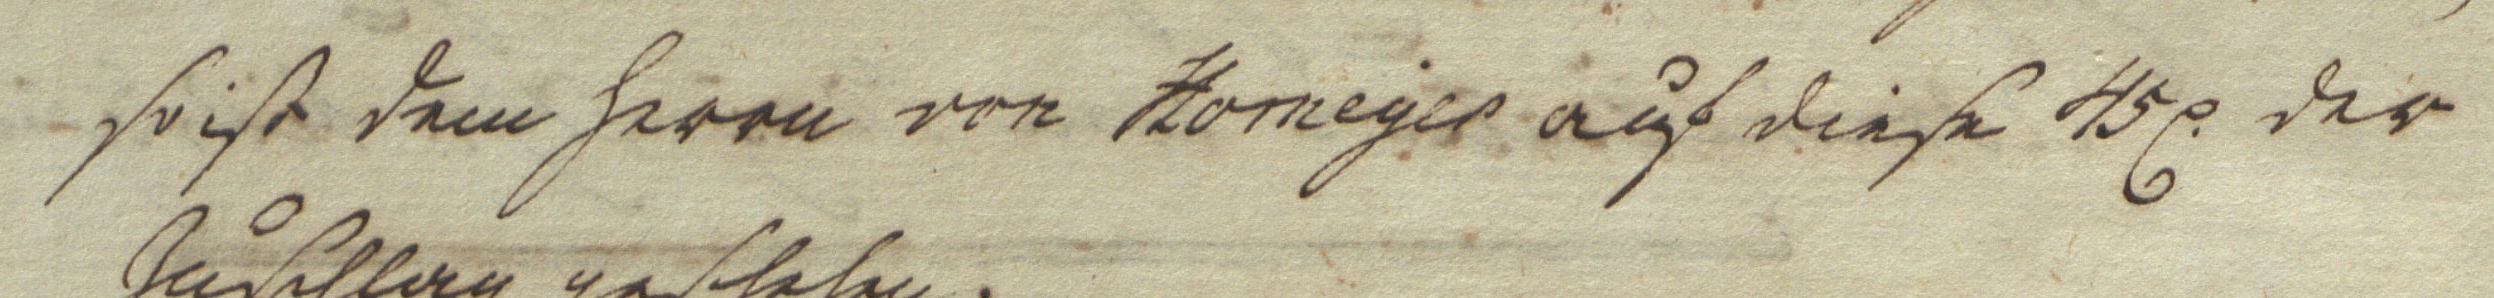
so ist dem Herrn von Homeyer auf diese 45 rtl. der
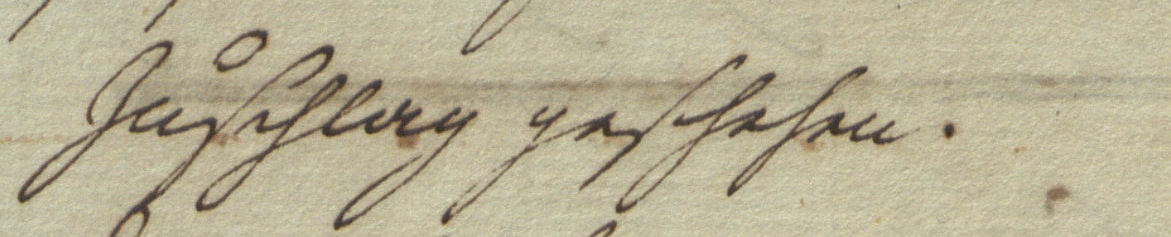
Zuschlag geschehen.
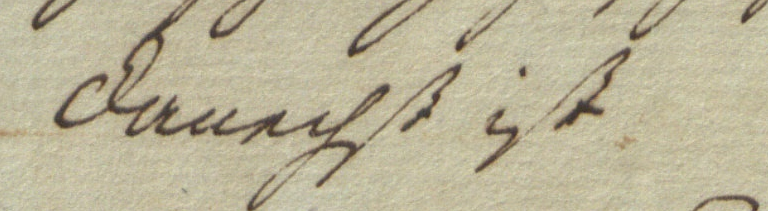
Danechst ist
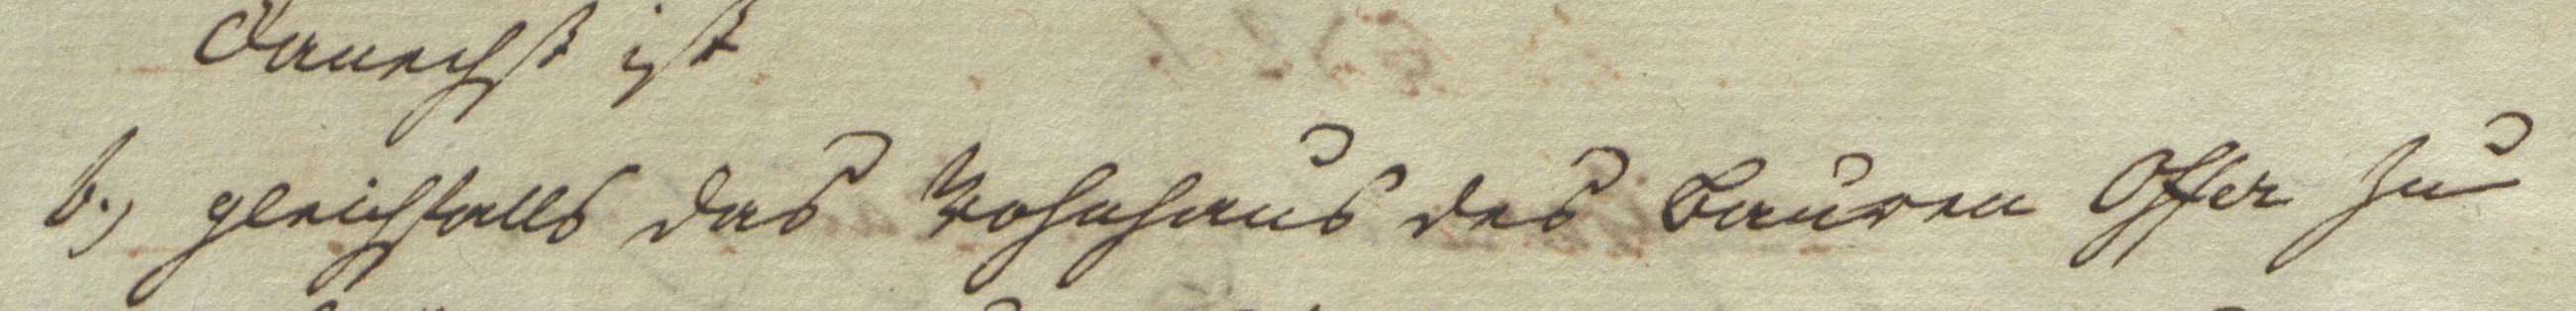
b., gleichfalls das Wohnhaus des Bauren Offer zu
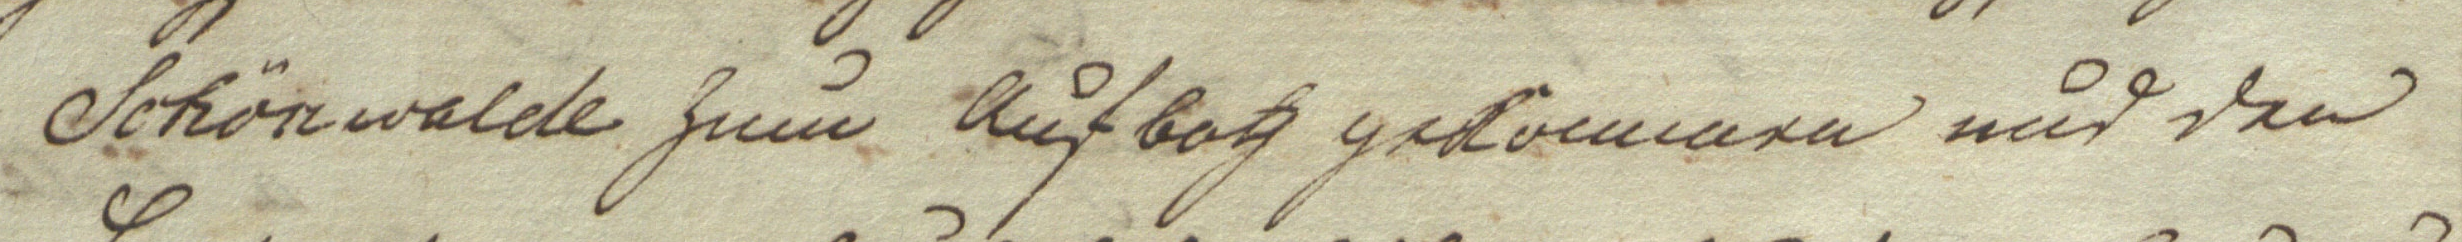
Schönwalde zum Aufboth gekommen und den
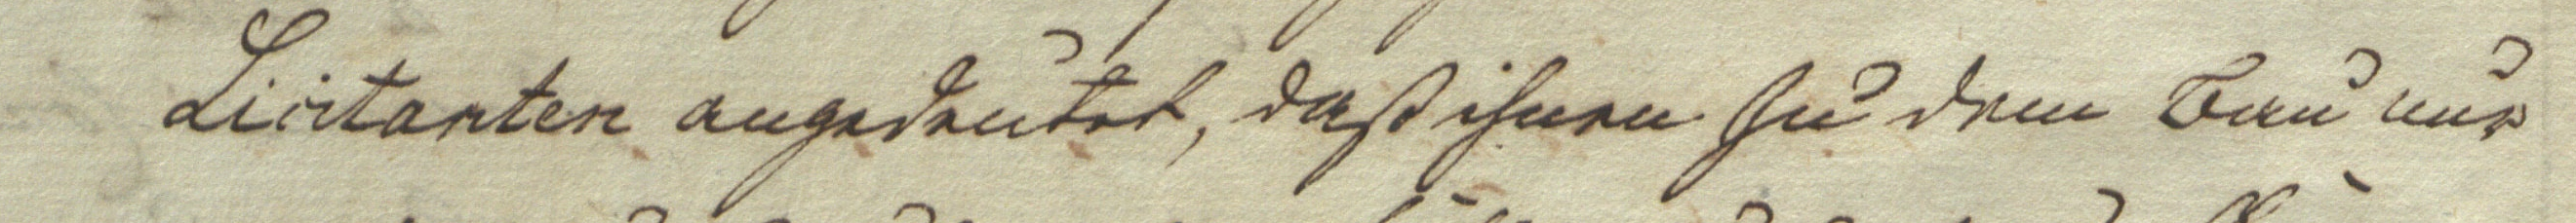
Licitanten angeeutet, daß ihnen zu dem Bau nur
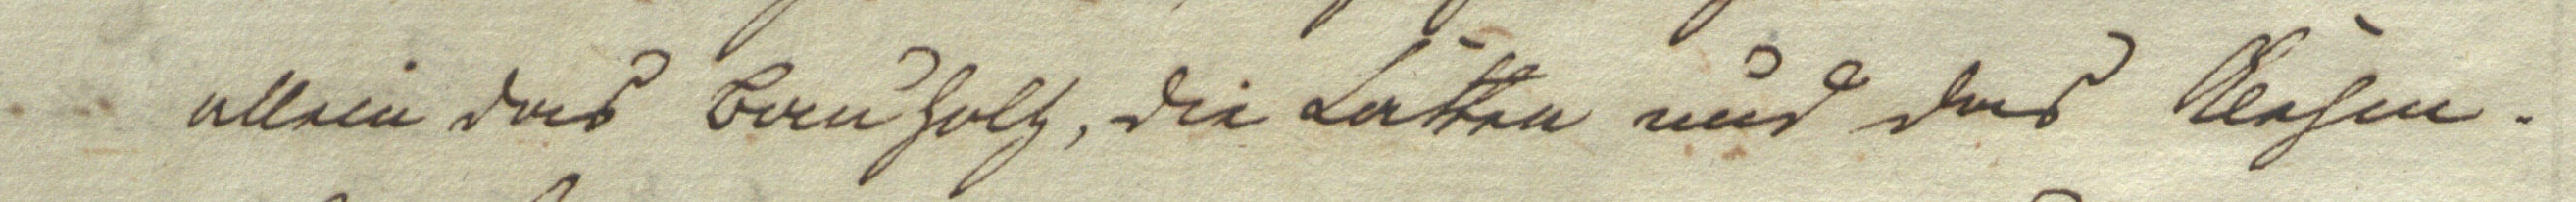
allein das Bauholz, die Latten und das Lehm¬
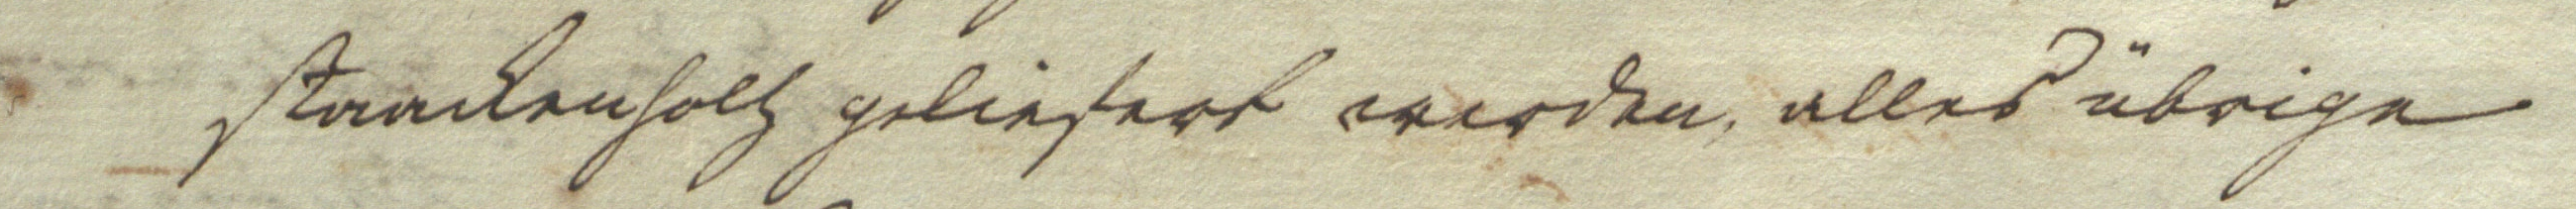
staakenholz geliefert werden, alles übrige
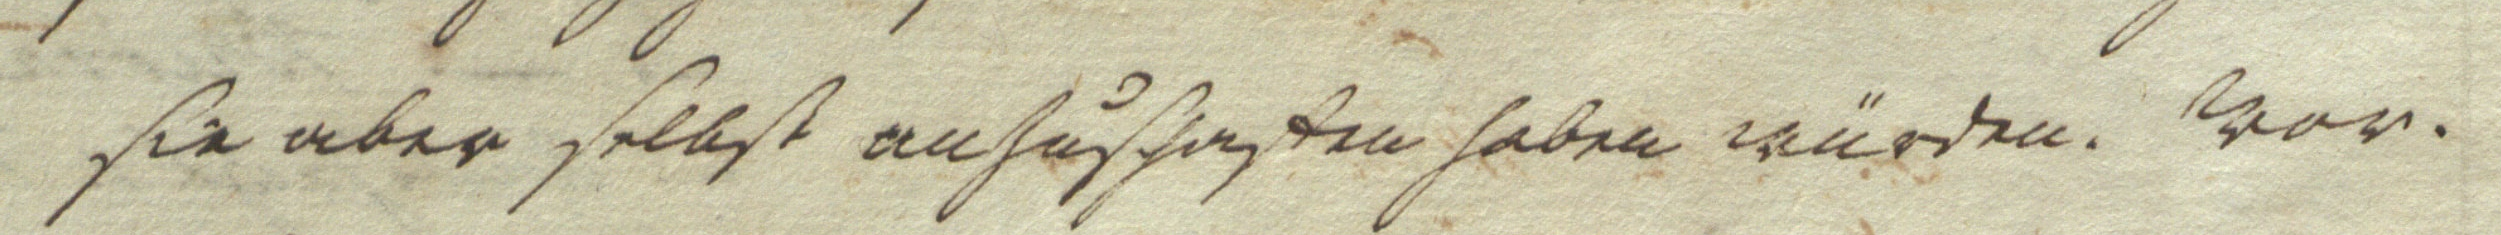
sie aber selbst anzuschaffen haben würden. Wor¬
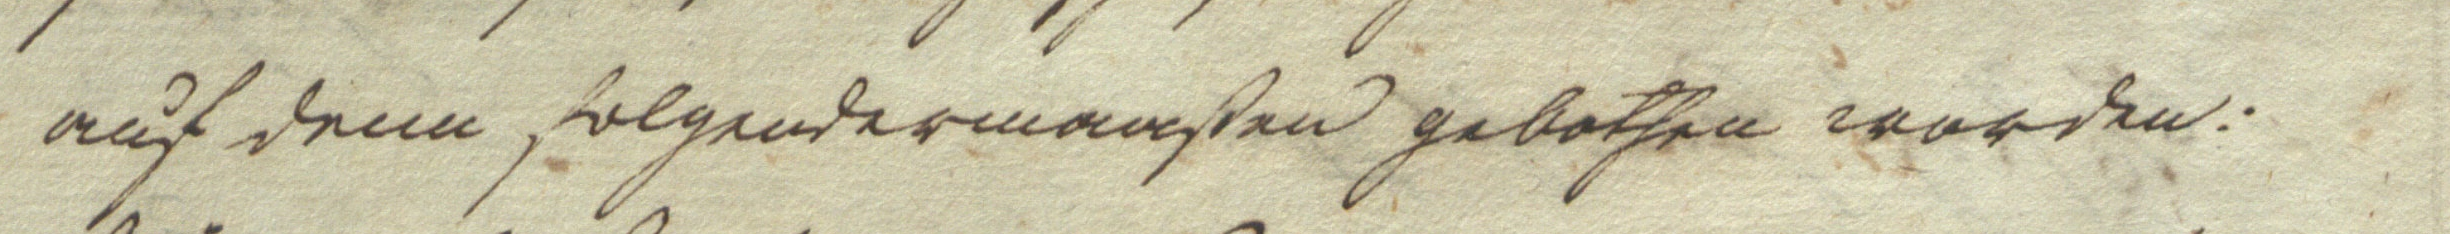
auf denn folgendermaaßen gebothen worden.
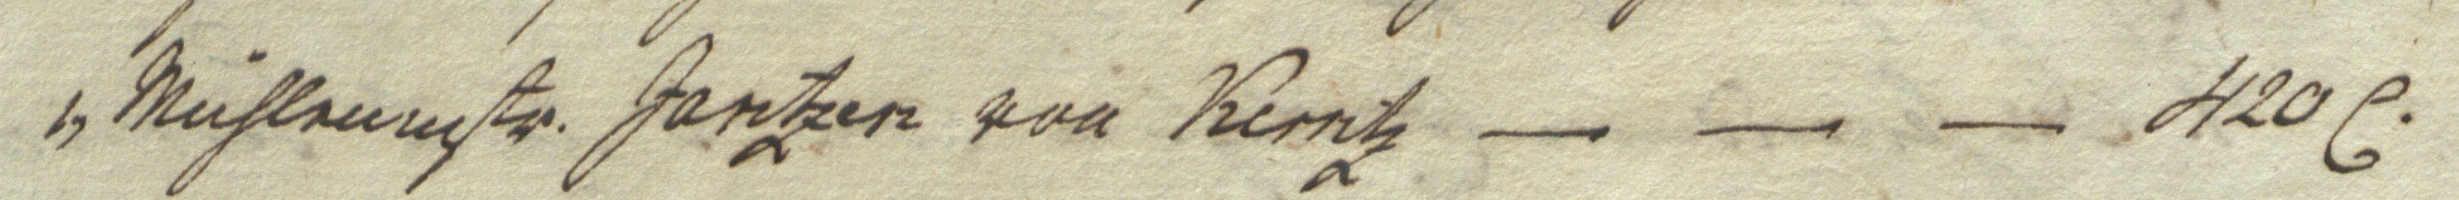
1, Mühlenmstr. Jantzen von Kemtz ---420 rtl.
